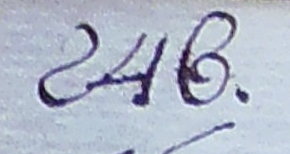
246.
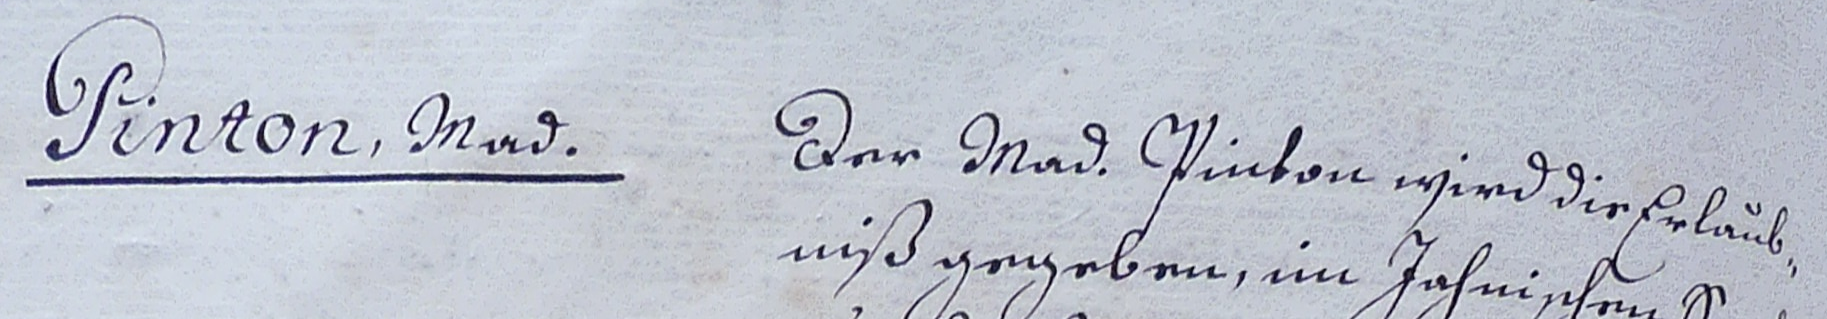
Pinton, Mad. Der Mad. Pinton wird die Erlaub¬
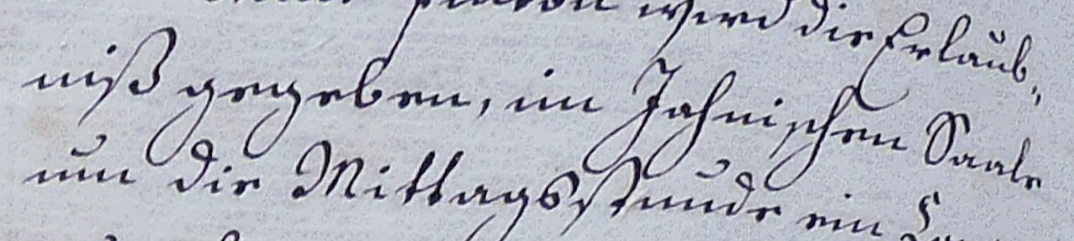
niß gegeben, im Jahnischen Saale
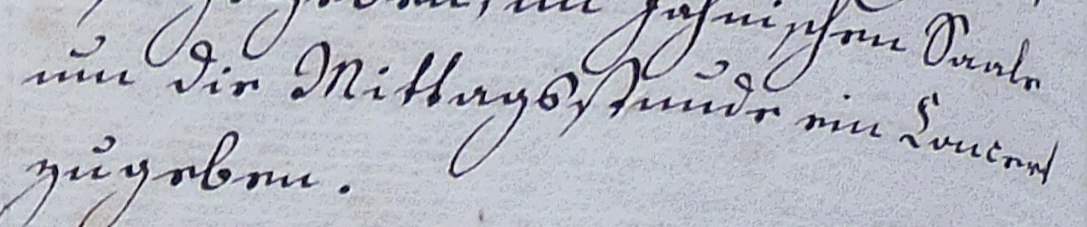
um die Mittagsstunde ein Concert
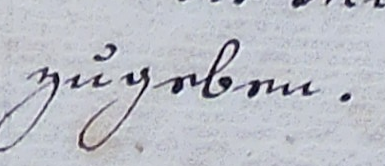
zugeben.
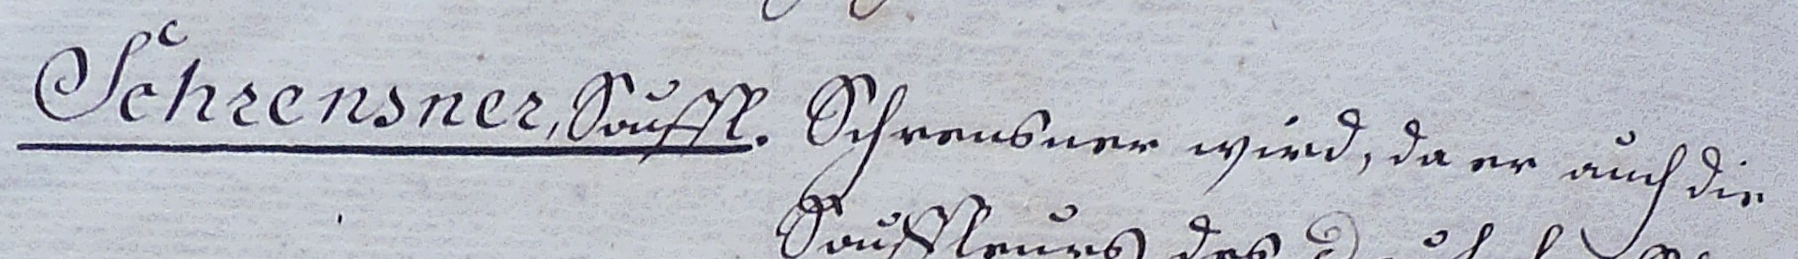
Schrensner, Souffl. Schrensner wird, da er auch die
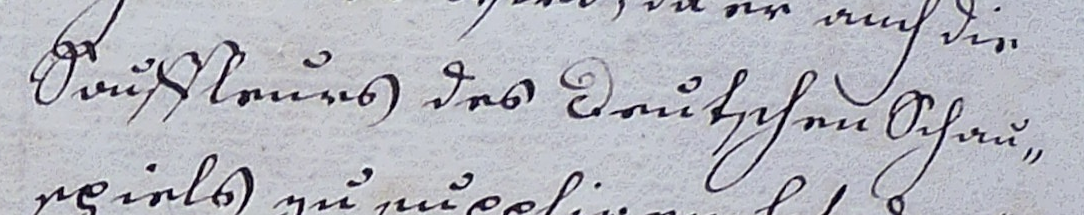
Souffleurs des Deutschen Schau¬
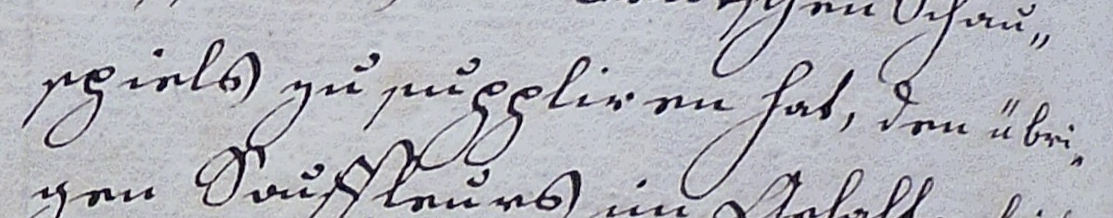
spiels zu suppliren hat, den übri¬
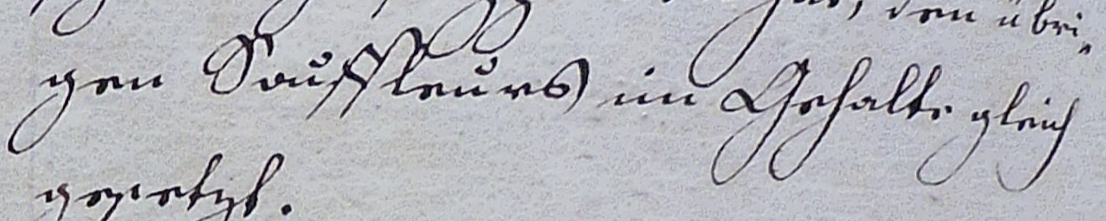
gen Souffleurs im Gehalte geich
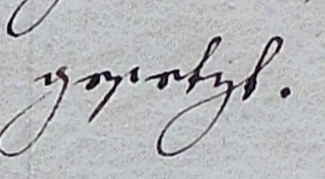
gesetzt.
